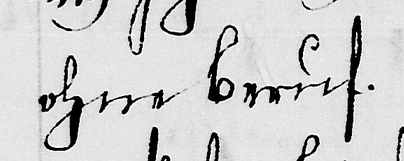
ohne Beruf.
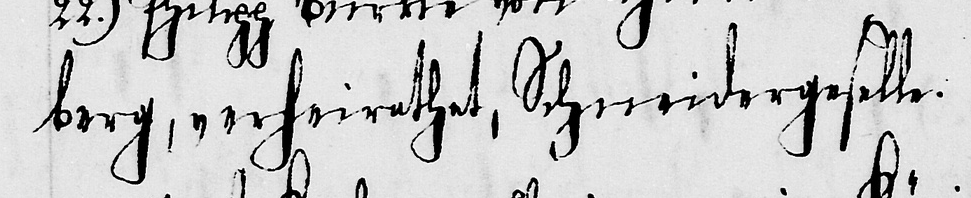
berg, verheirathet, Schneidergesel¬
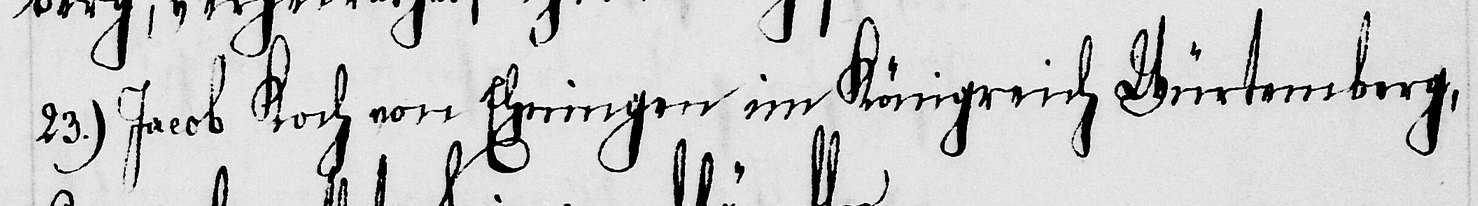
23.) Jacob Koch von Ehningen im Königreich Würtemberg,
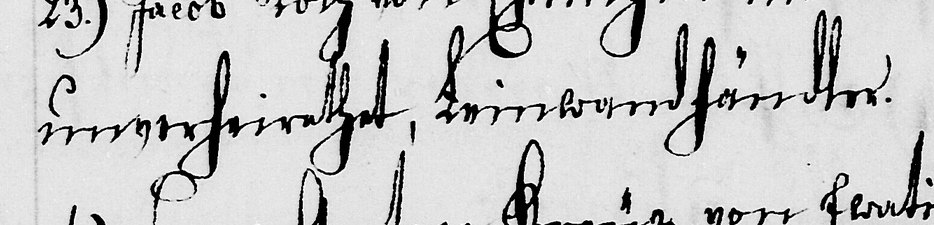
unverheirathet, Leinwandhändler.
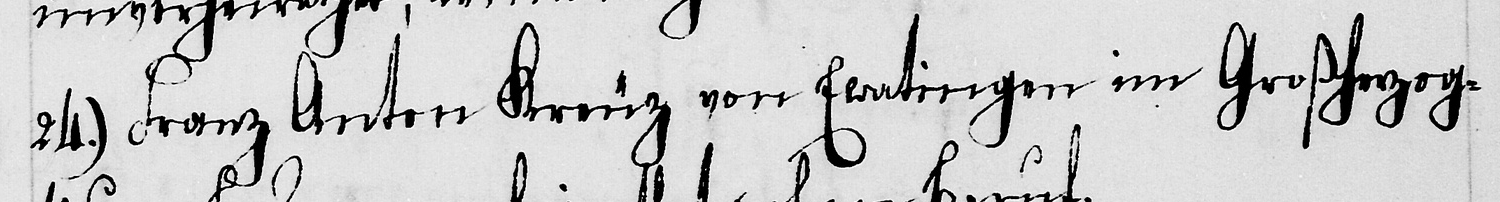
24.) Franz Anton Kreuz von Ewatingen im Großherzog¬
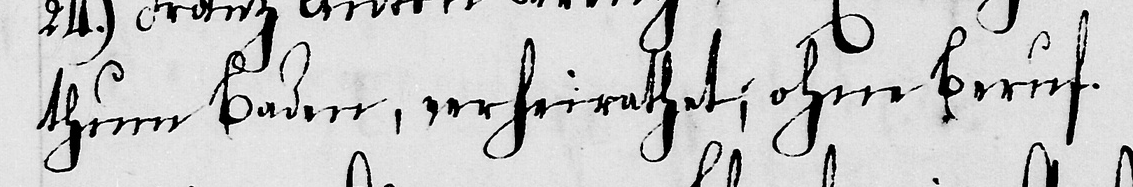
thum Baden, verheirathet; ohne Beruf.
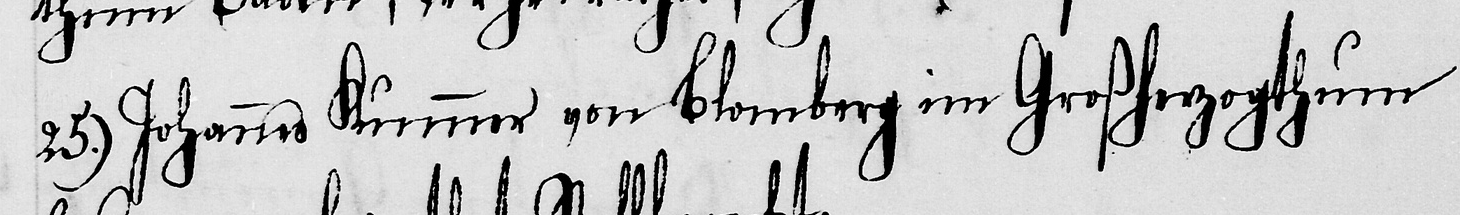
25.) Johannes Kummer von Blomberg im Großherzogthum
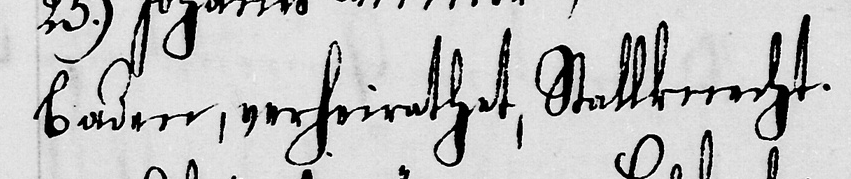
Baden, verheirathet, Stallknecht.
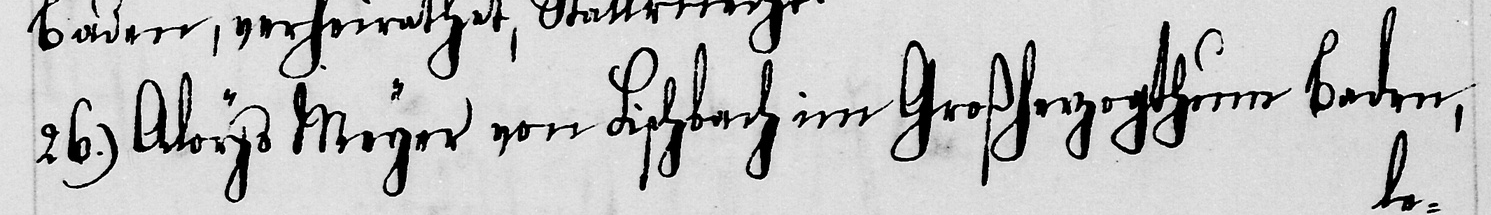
26.) Aloys Meyer von Fischbach im Großherzogthum Baden,
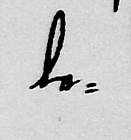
le.
